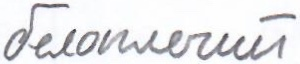белоплечий
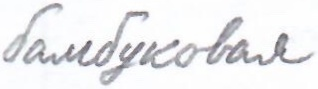бамбуковая
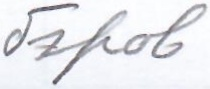бэров
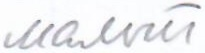малый
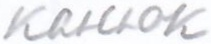канюк
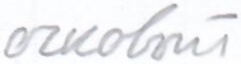очковый
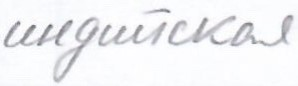индийская
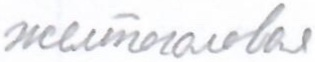желтоголовая
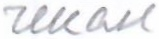чекан
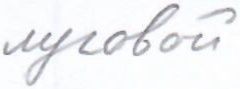луговой
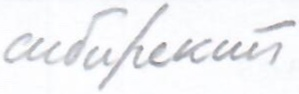сибирский
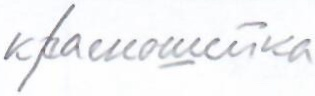красношейка
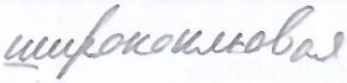ширококлювая
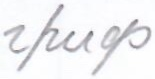гриф
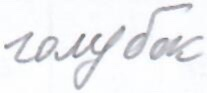голубок
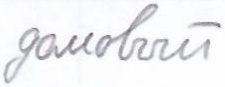домовый
